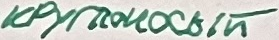круглоносый
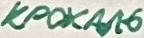крохаль
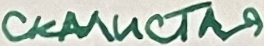скалистая
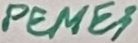ремез
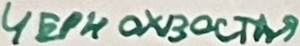чернохвостая
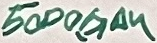бородач
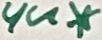чиж
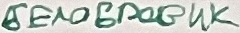белобровик
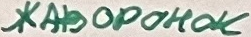жаворонок
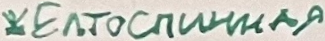желтоспинная
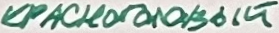красноголовый
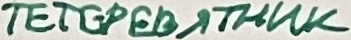тетеревятник
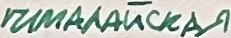гималайская
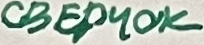сверчок
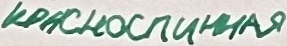красноспинная
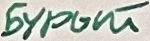бурый
